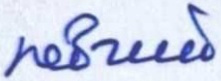певчий
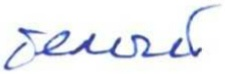белый
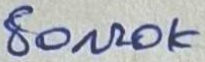волчок
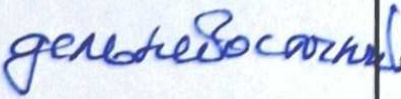дельневосточный
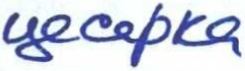цесарка
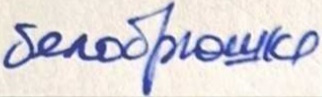белобрюшка
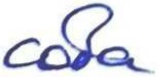сова
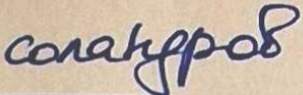соландров
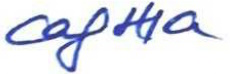саджа
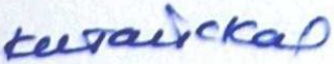китайская
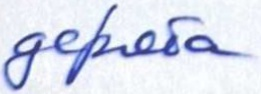деряба
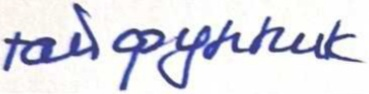тайфунник
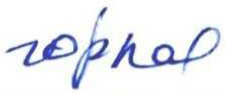горпая
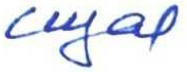сизая
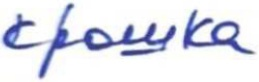крошка
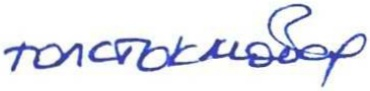толстоклювоя
